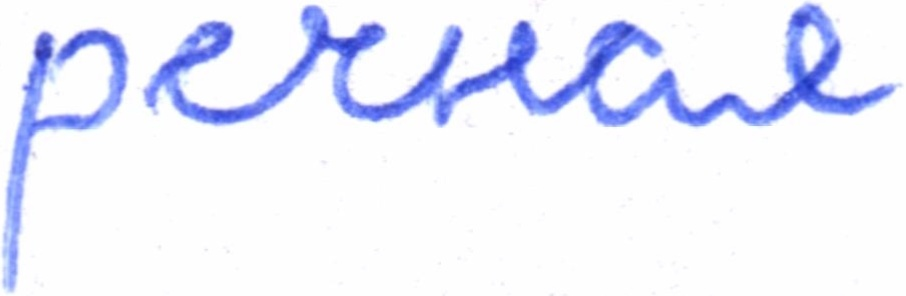речная
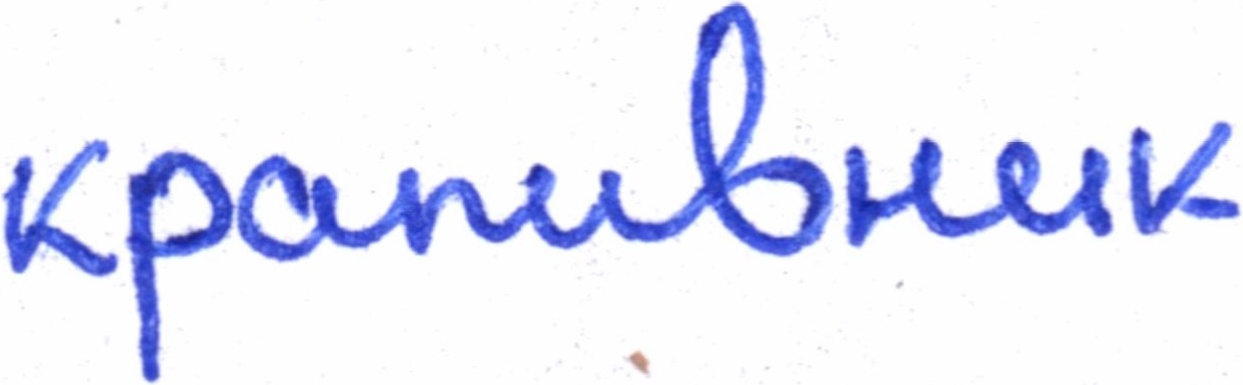крапивник
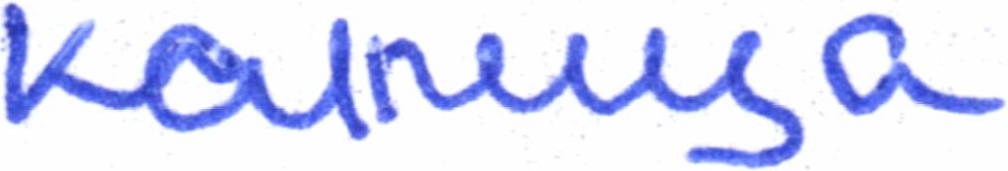колпица
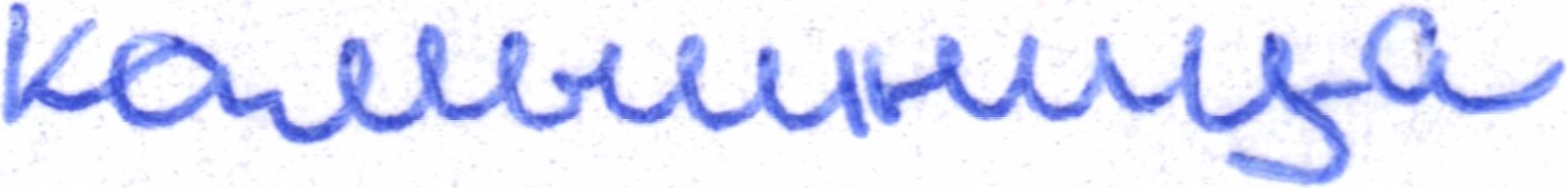камышница
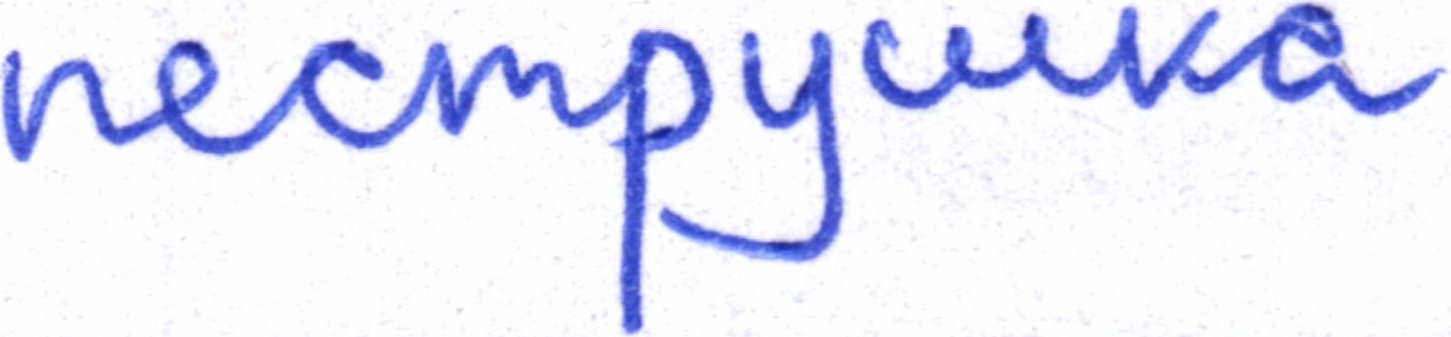пеструшка
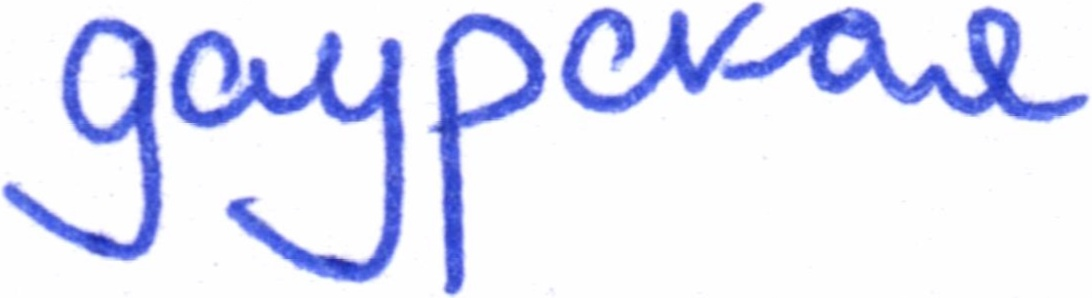даурская
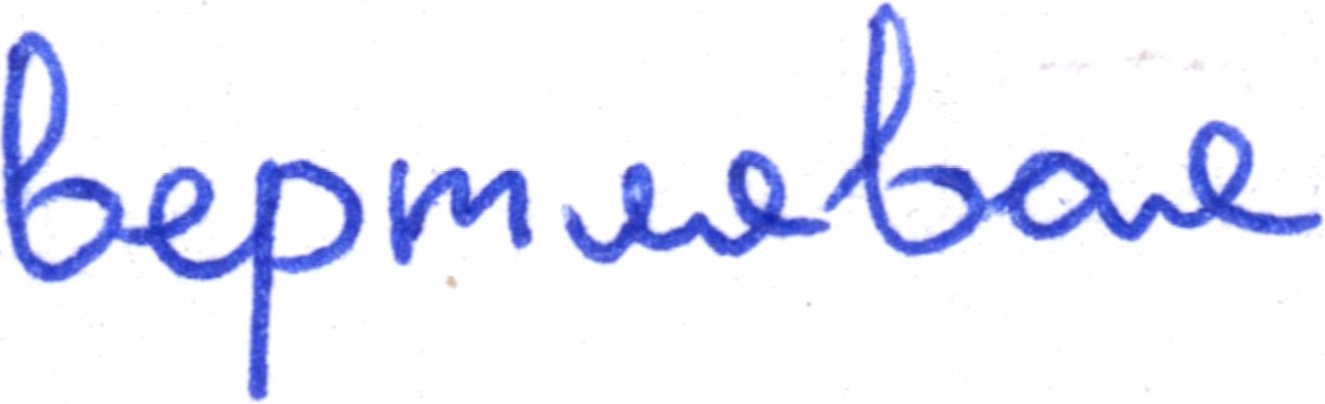вертлявая
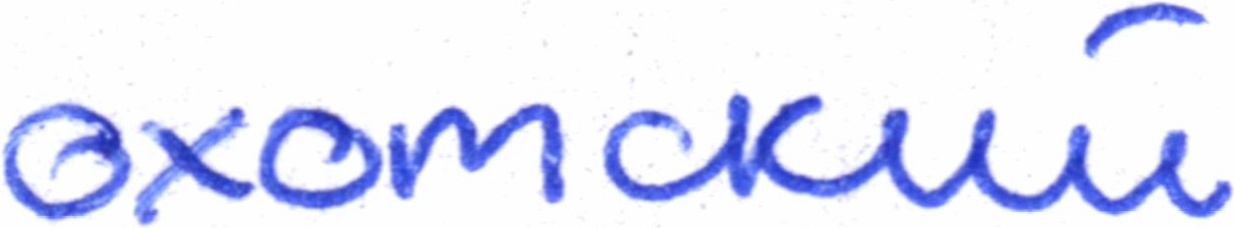охотский
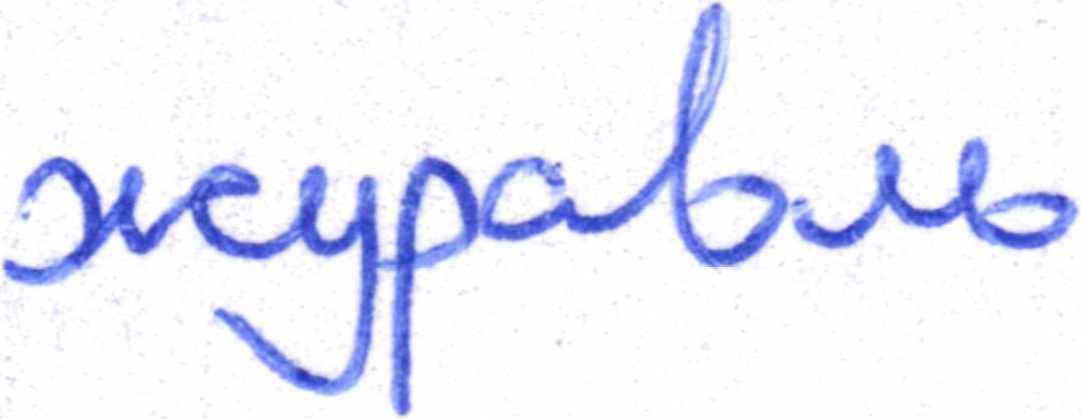журавль
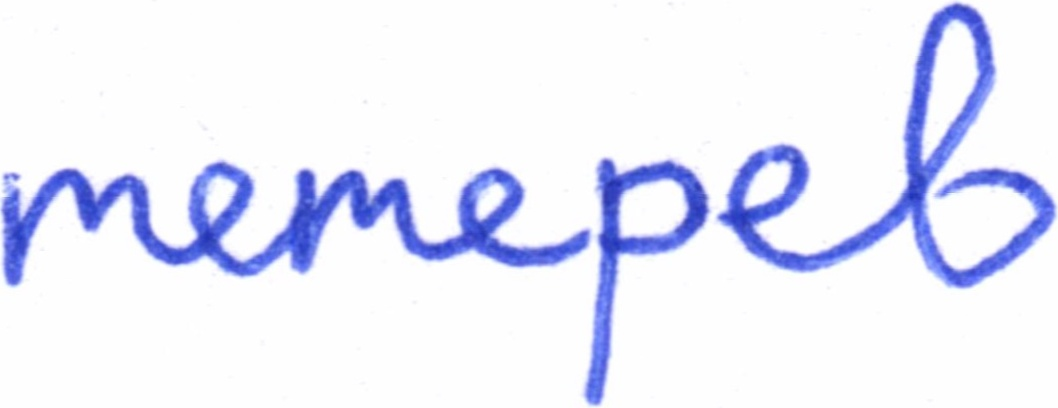тетерев
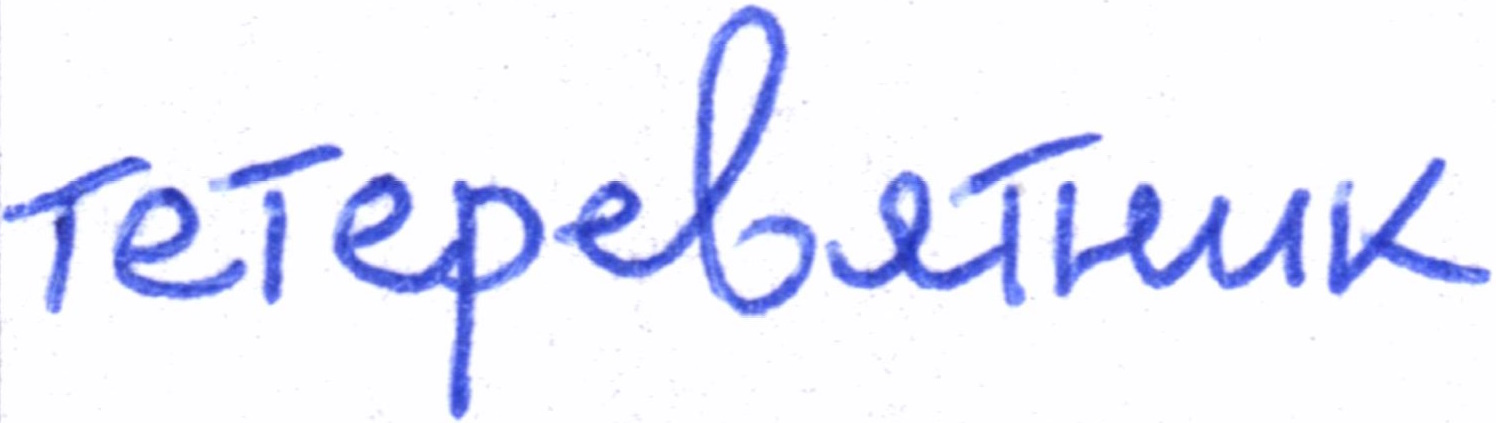тетеревятник
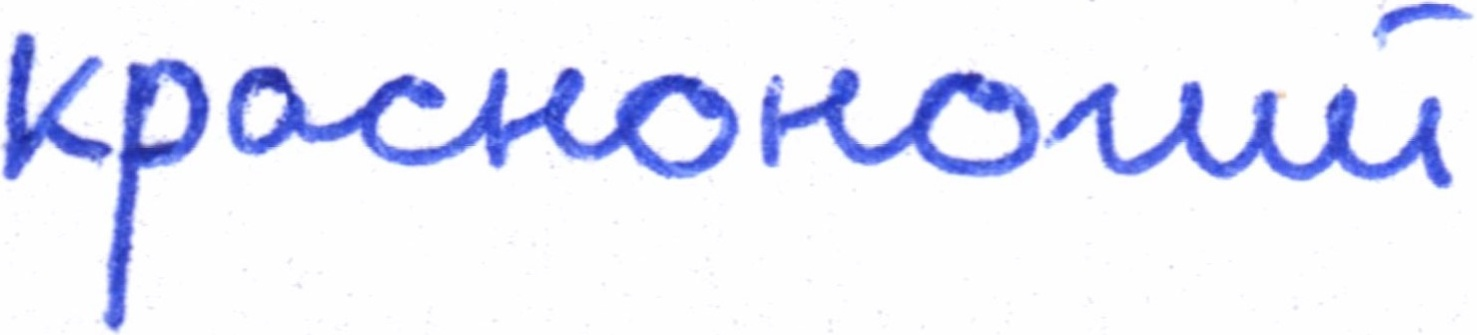красноногий
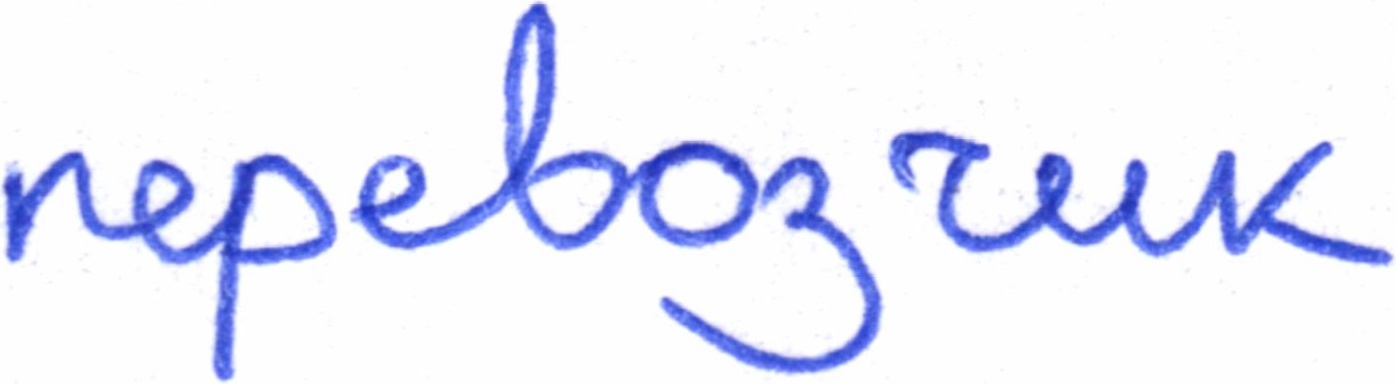перевозчик
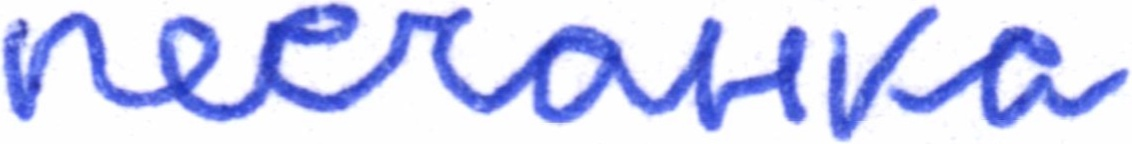песчанка
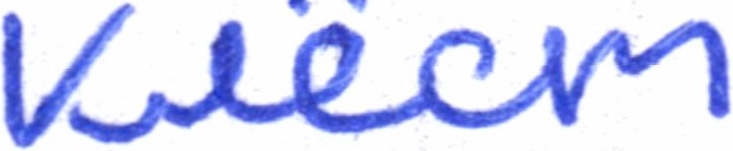клёст
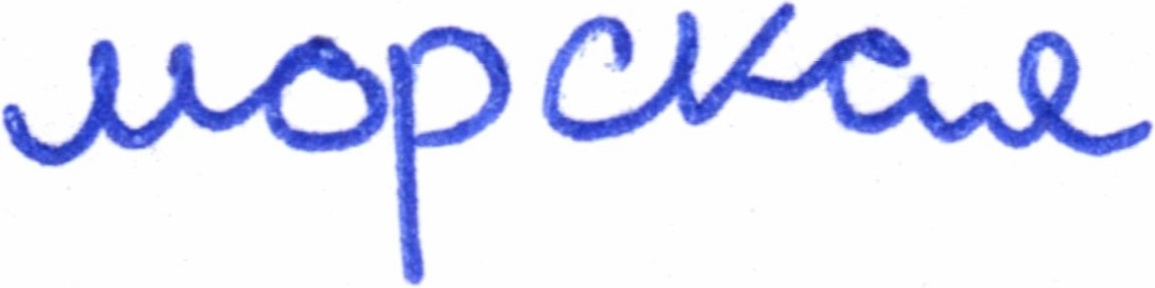морская
